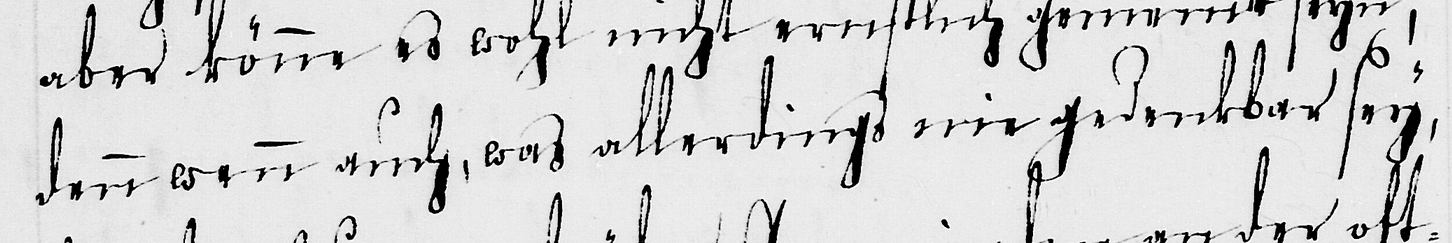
denn wenn auch, was allerdings nie gedenkbar sey,
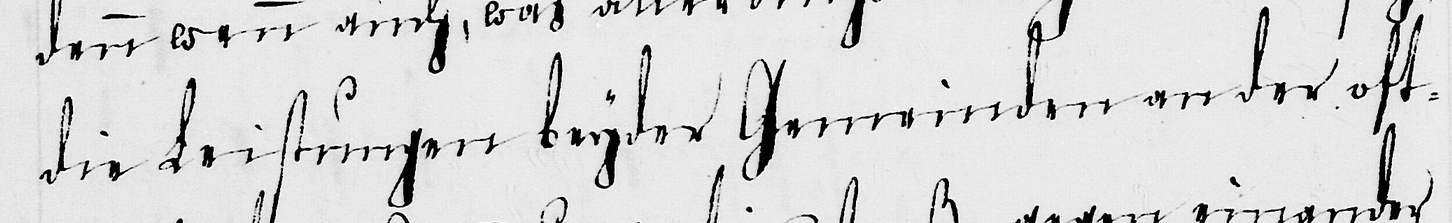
die Leistungen beyder Gemeinden an der oft¬
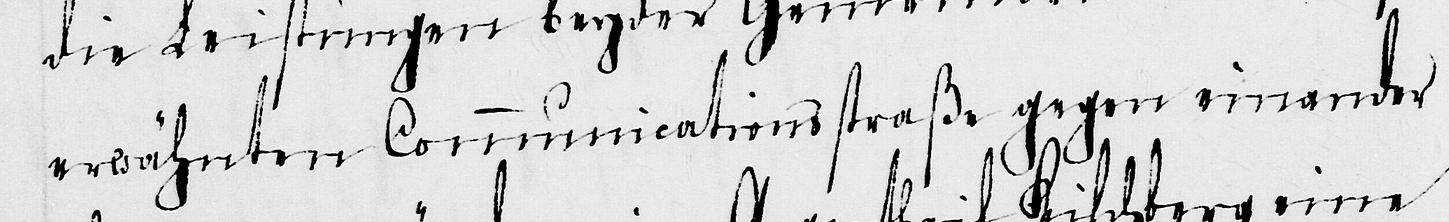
erwähnten Communicationsstraße gegen einander
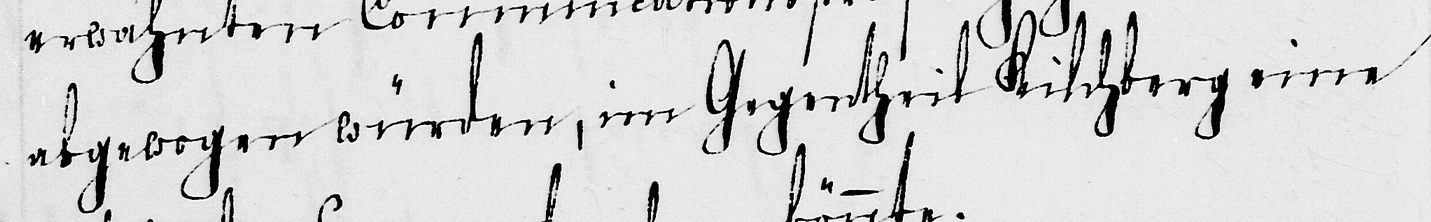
abgewogen würden, im Gegentheil Kilchberg eine
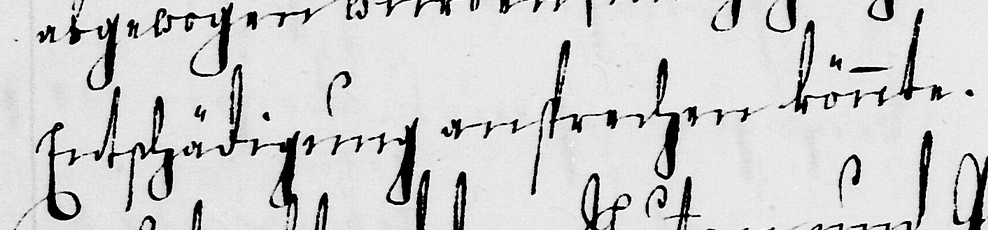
Entschädigung ansprechen könnte.
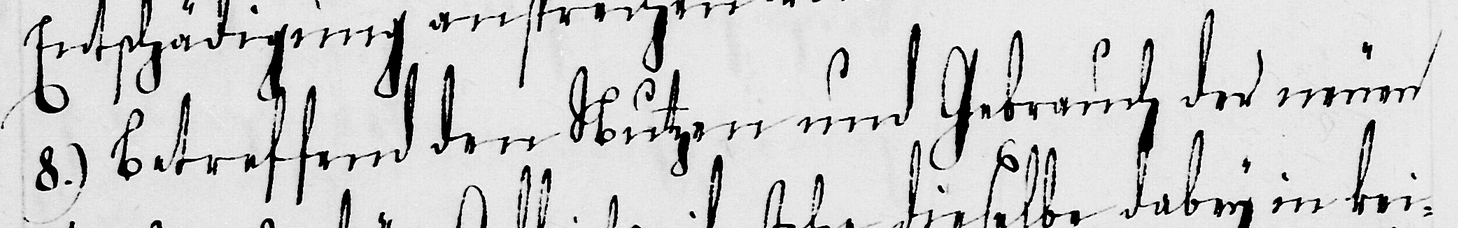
8.) Betreffend den Nutzen und Gebrauch der neuen
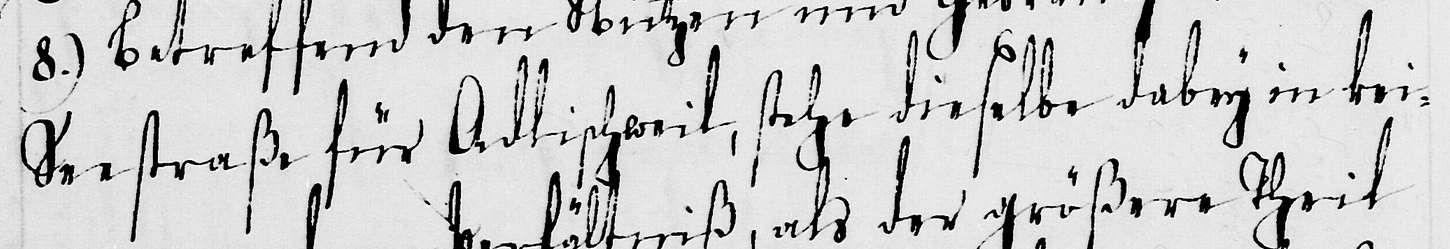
Seestraße für Adlischweil, stehe dieselbe dabey in kei¬
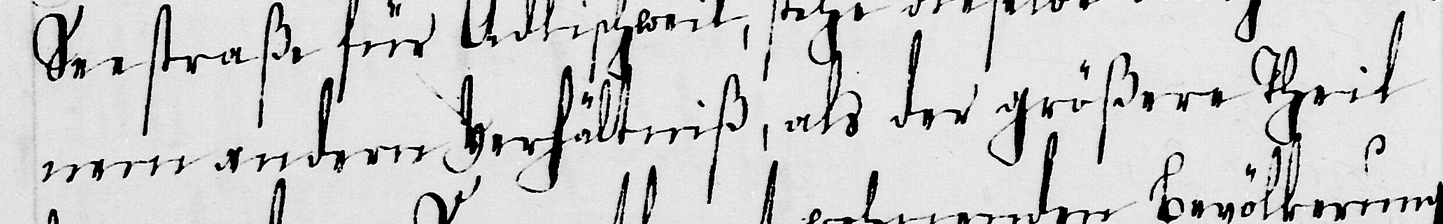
nem andern Verhältniß, als der größere Theil
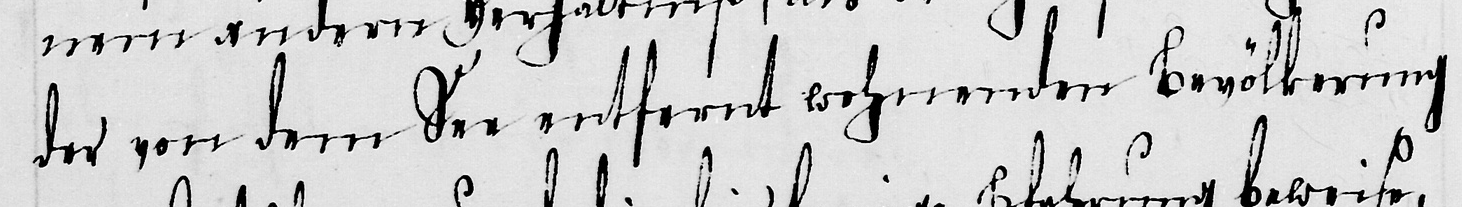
der von dem See entfernt wohnenden Bevölkerung
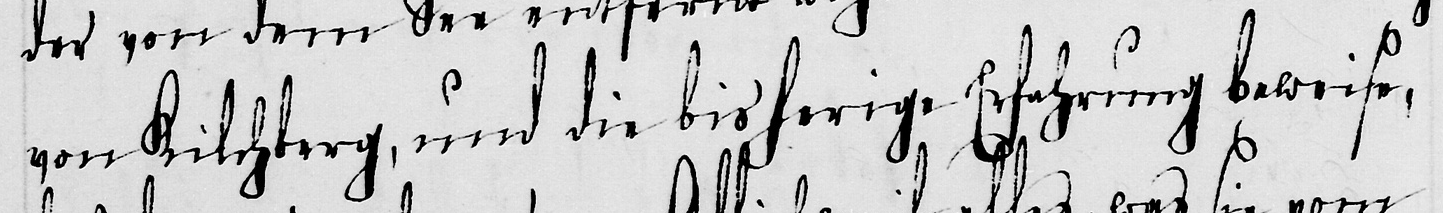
von Kilchberg, und die bisherige Erfahrung beweise,
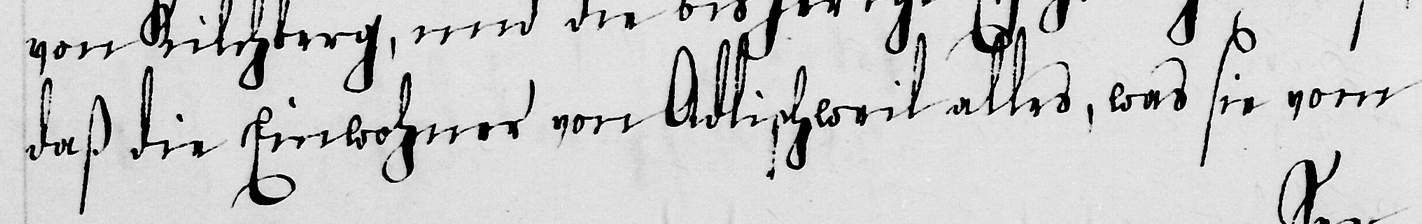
daß die Einwohner von Adlischweil alles, was sie vom
